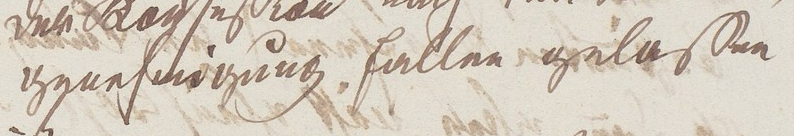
genehmigung fallen gelassen
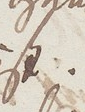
ist.
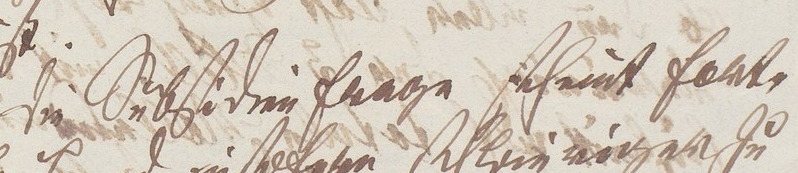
Die Subsidienfrage scheint fort-
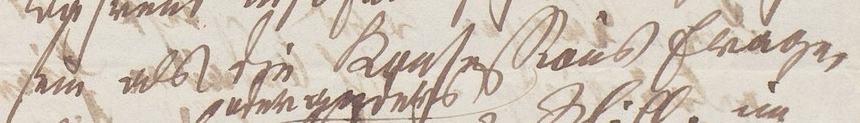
sein als die Konzessionsfrage,
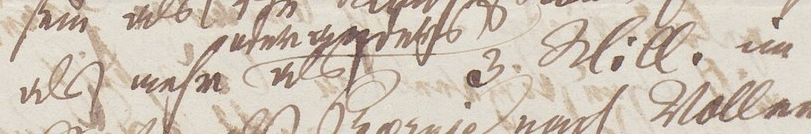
als mehr oder anders als 3 Mill. im
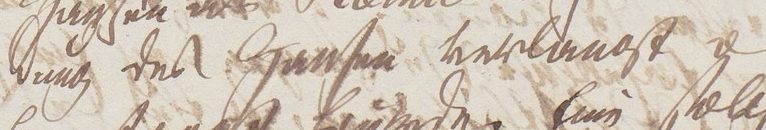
dung des Ganzen verlangt &
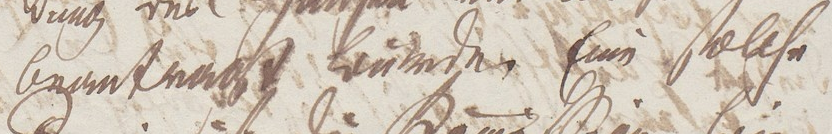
beantragt wurde. Eine solche
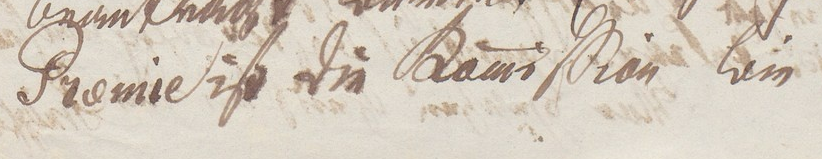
Præmie ist die Kommission wie
